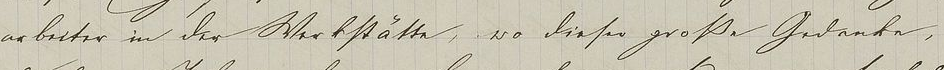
arbeiter in der Werkstätte, wo dieser große Gedanke,
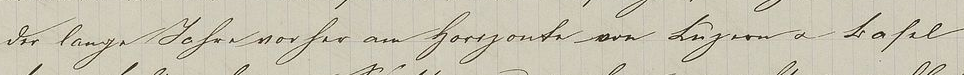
der lange Jahre vorher am Horizonte von Luzern & Basel
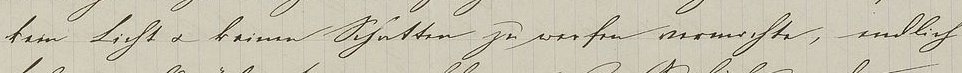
kein Licht & keinen Schatten zu werfen vermochte, endlich
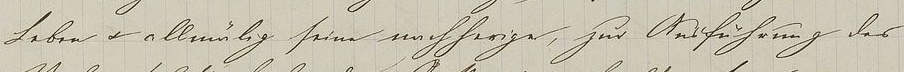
Leben & allmälig seine nachherige, zur Ausführung des
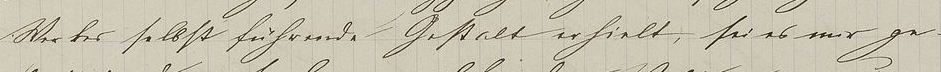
Werkes selbst führende Gestalt erhielt, sei es mir ge-
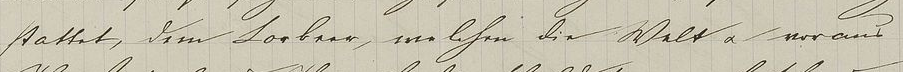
stattet, dem Lorbeer, welchen die Welt & voraus
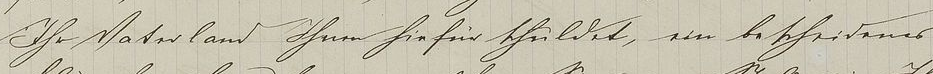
Ihr Vaterland Ihnen hiefür schuldet, ein bescheidenes
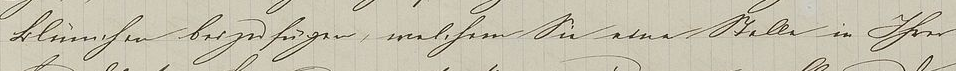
Blümchen beizufügen, welchem Sie eine Stelle in Ihrer
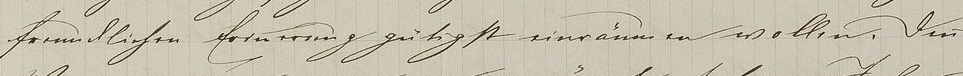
freundlichen Erinnerung gütigst einräumen wollen. Denn
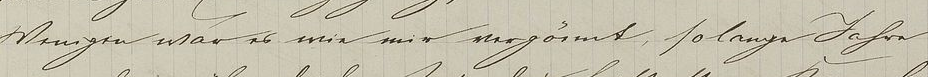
Wenigen war es wie mir vergönnt, so lange Jahre
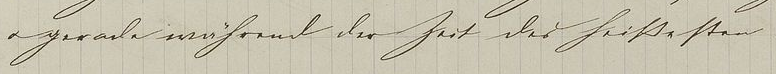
& gerade während der Zeit des heißesten
